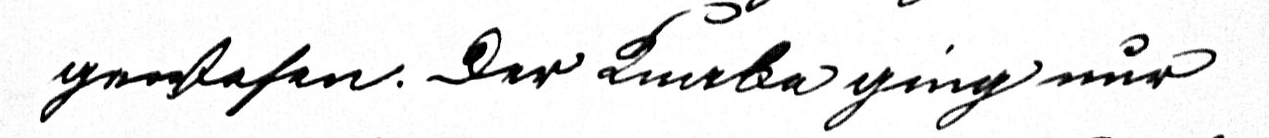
gewesen: Der Knabe ging nur
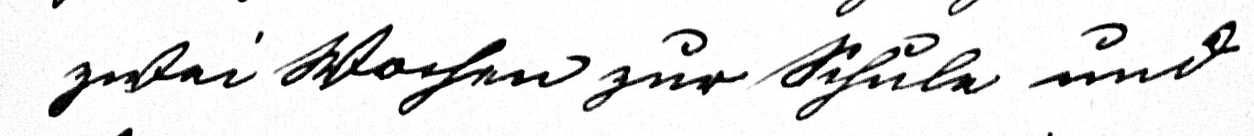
zwei Wochen zur Schule und
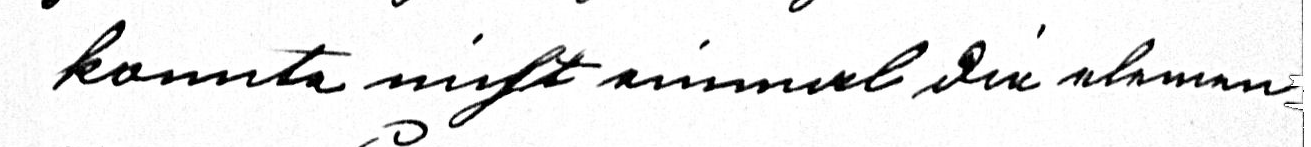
konnte nicht einmal die elemen¬
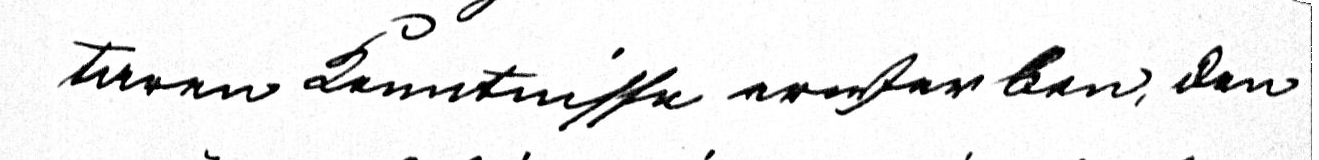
taren Kenntnisse erwerben, den
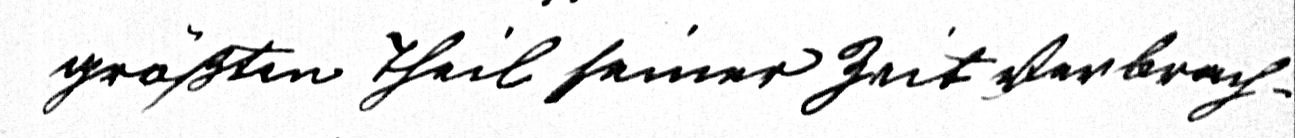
größten Theil seiner Zeit verbrach¬
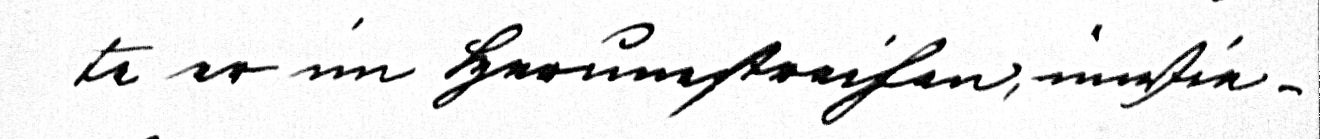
te er im Herumstreifen, inwie¬
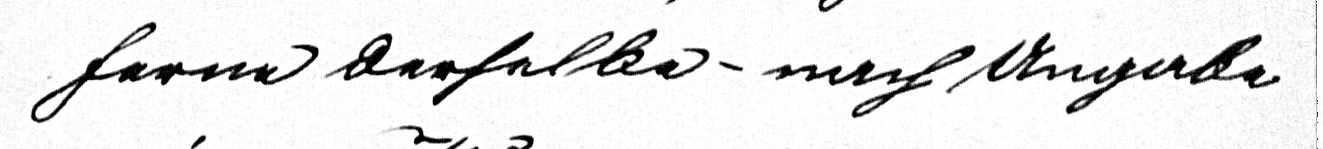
ferne derselbe - nach Angabe
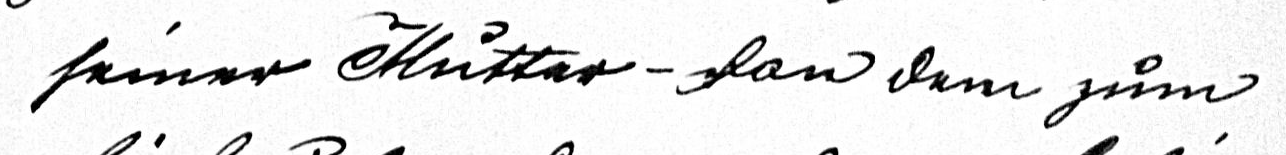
seiner Mutter - von dem zum
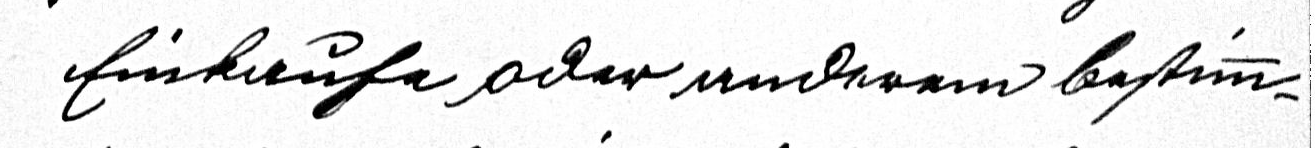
Einkaufe oder anderem bestimm¬
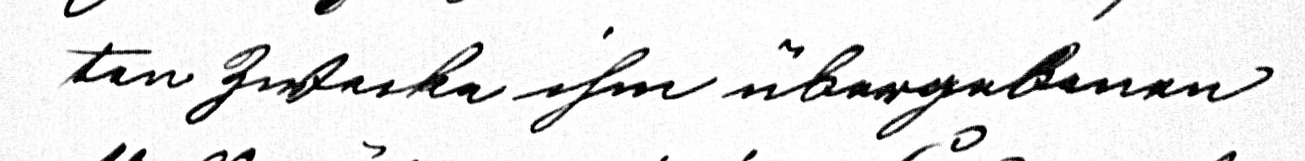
ten Zwecke ihm übergebenen
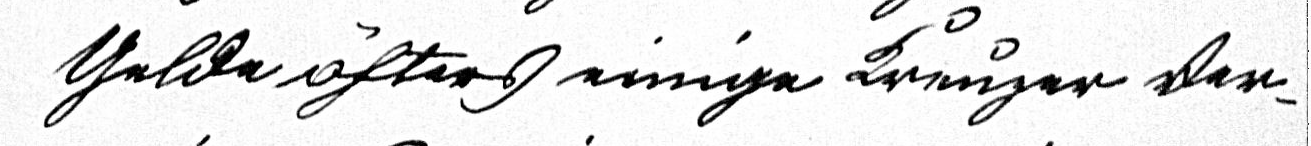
Gelde öfters einige Kreuzer Ver¬
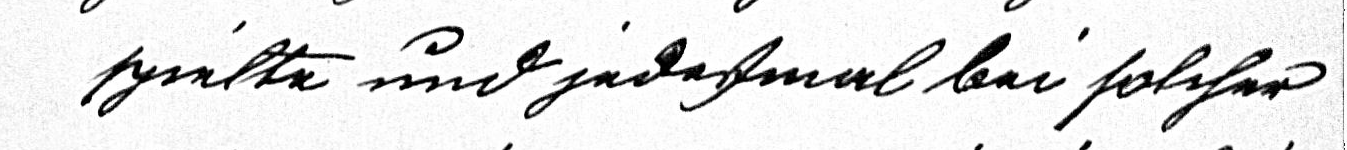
spielte und jedesmal bei solcher
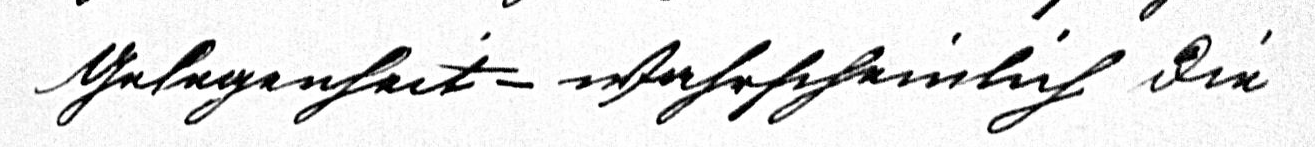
Gelegenheit - wahrscheinlich die
